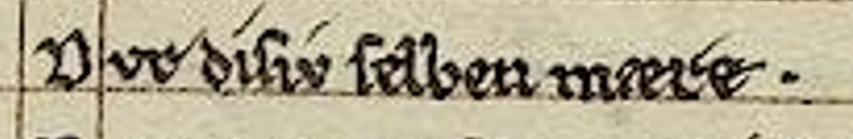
Dvr diſiv ſelben m[ae]re.
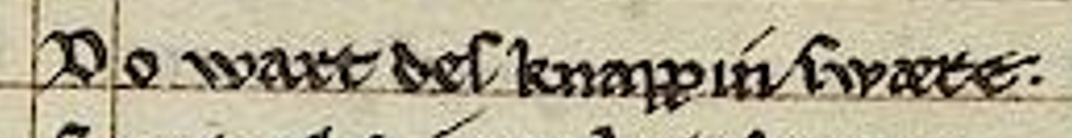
Do wart deſ knappin ſw[ae]re.
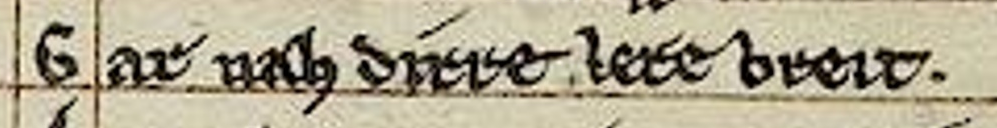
Gar nah dirre lere breit.
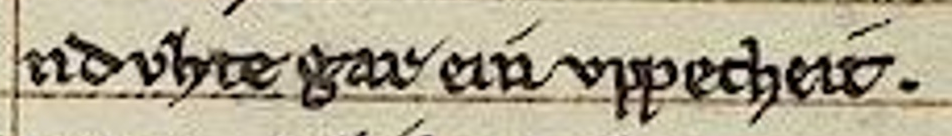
Indvhte gar ein vppecheit.
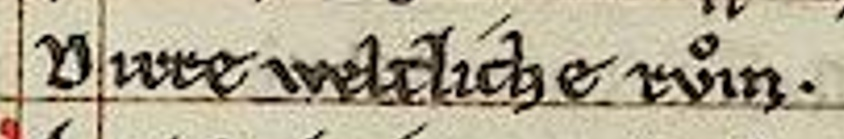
Dirre weltiche rv°om.
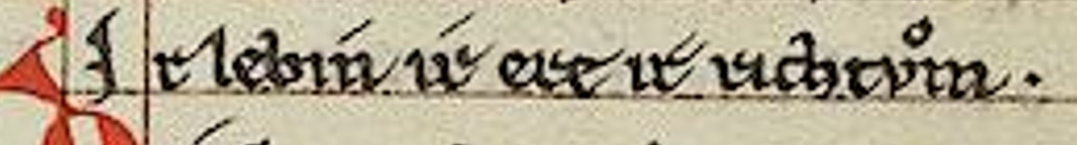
Irlebin ir ere ir richtv°om.
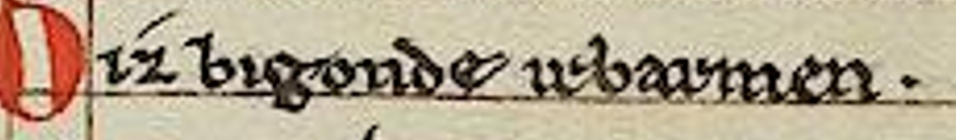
*Diz bigonde irbarmen.
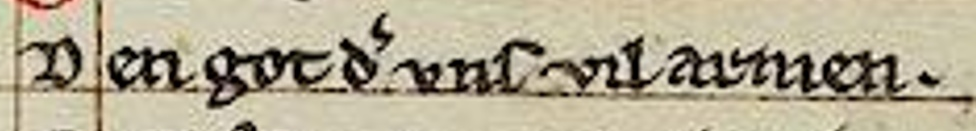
Den got d(er) vnſ vil armen.
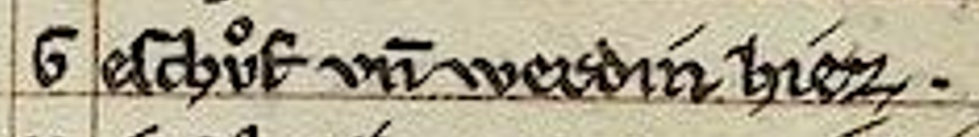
Geſchv°of vn(d) werdin hiez.
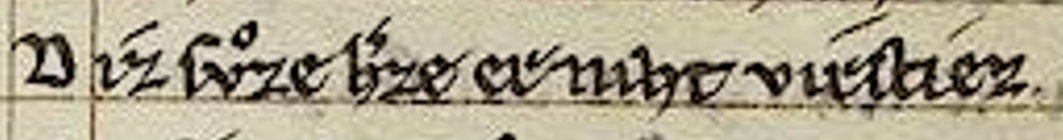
Diz ſv°oze h(er)ze er niht virſtiez.
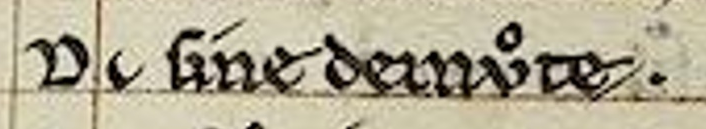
D(az) ſine demv°ote.
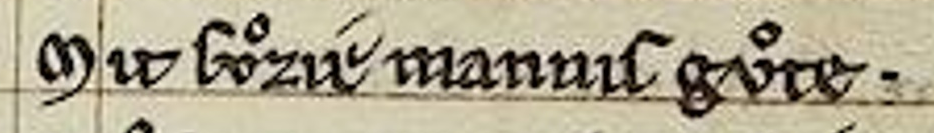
Mit ſv°ozir mannis gv°ote.
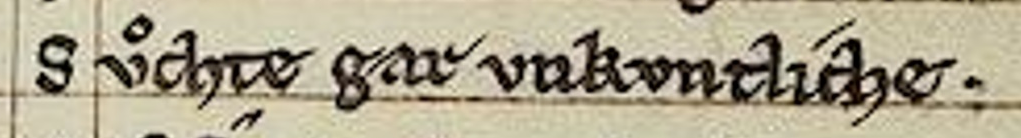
Sv°ochte gar vnkvtliche.
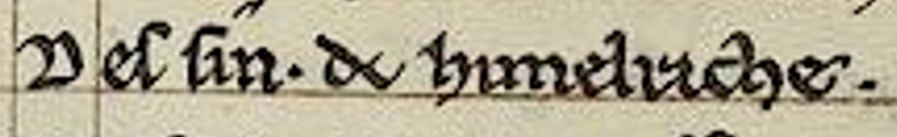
Deſ ſin. daz himelriche.
